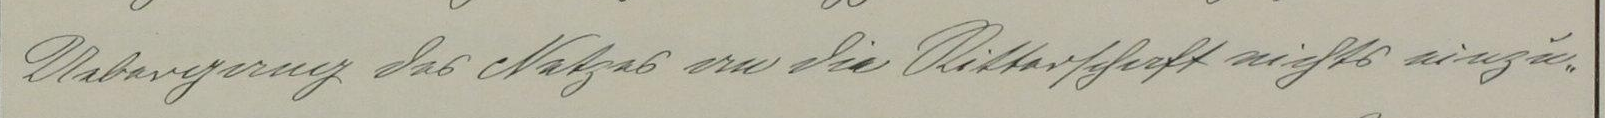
Uebergang des Netzes an die Ritterschaft nichts einzu-
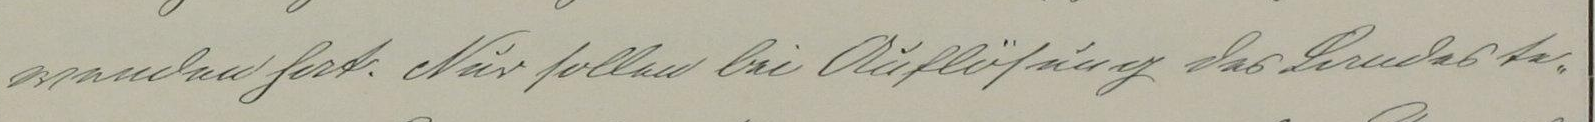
wenden hat. Nur sollen bei Auflösung des Landeste-
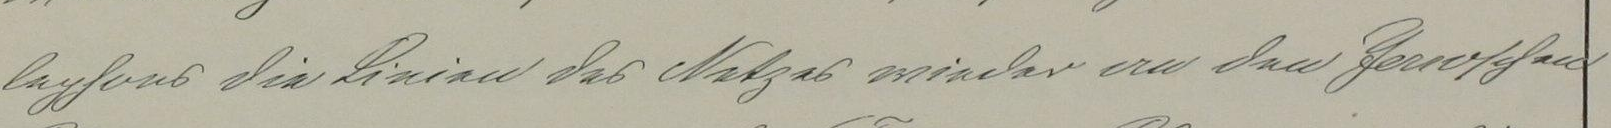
lephons die Linien des Netzes wieder an den Jerwschen
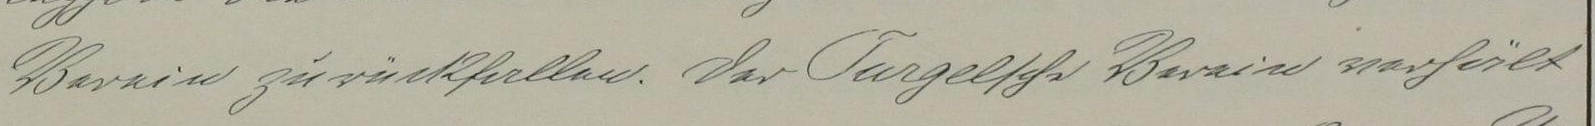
Verein zurückfallen. Der Turgelsche Verein verhält
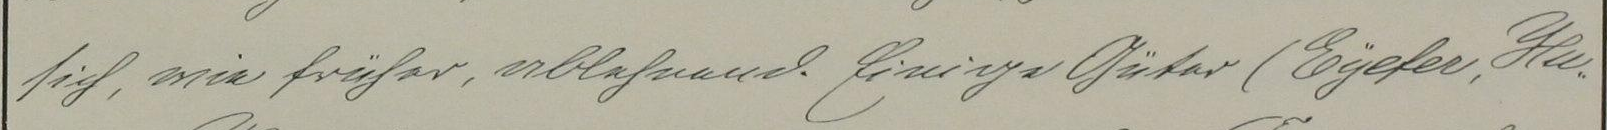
sich, wie früher, ablehnend. Einige Güter (Eyefer, Hu-
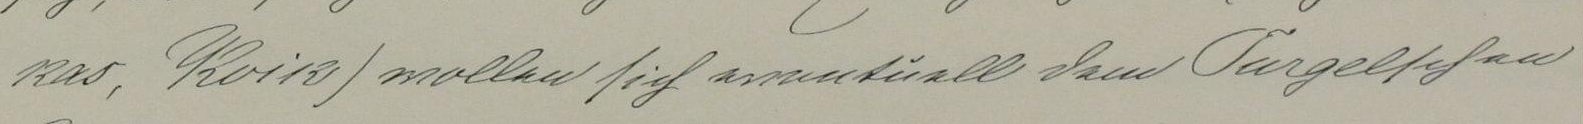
kas, Koik) wollen sich eventuell dem Turgelschen
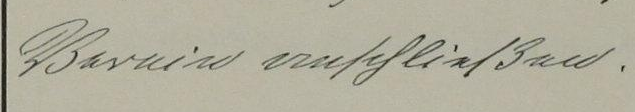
Verein anschließen.
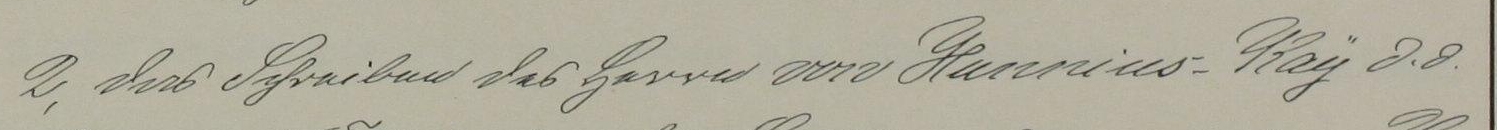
2. das Schreiben des Herrn von Hunnius-Kay d.d.
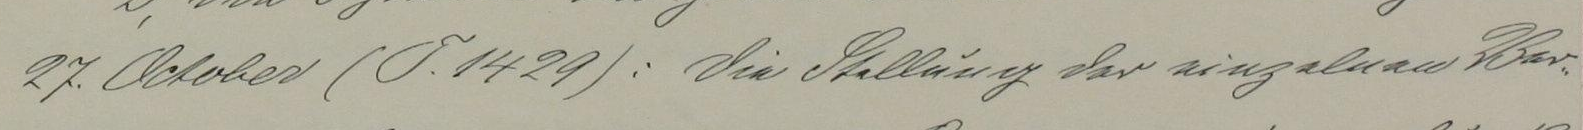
27. October (T.1429): Die Stellung der einzelnen Ver-
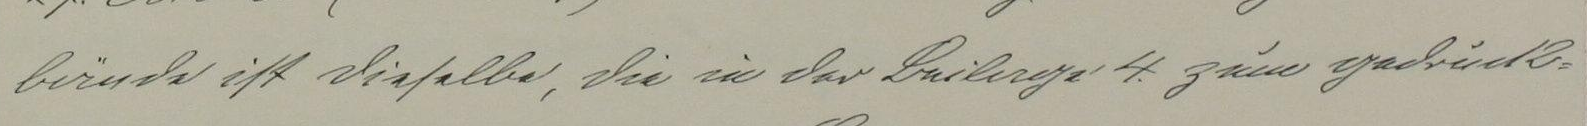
bände ist dieselbe, die in der Beilage 4 zum gedruck-
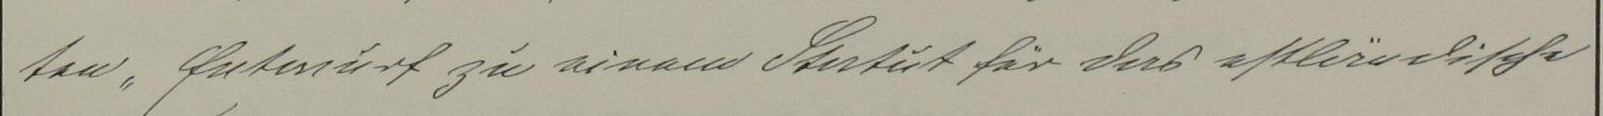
ten „Entwurf zu einem Statut für das estländische
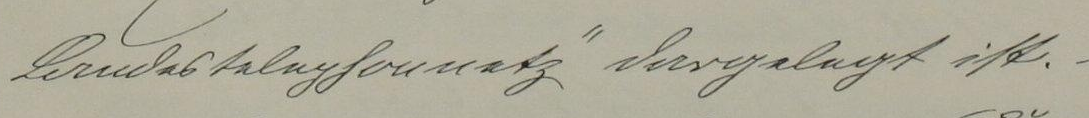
Landestelephonnetz“ dargelegt ist.
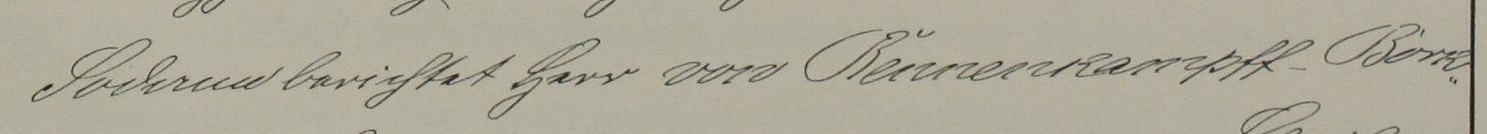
Sodann berichtet Herr von Rennenkampff-Bork-
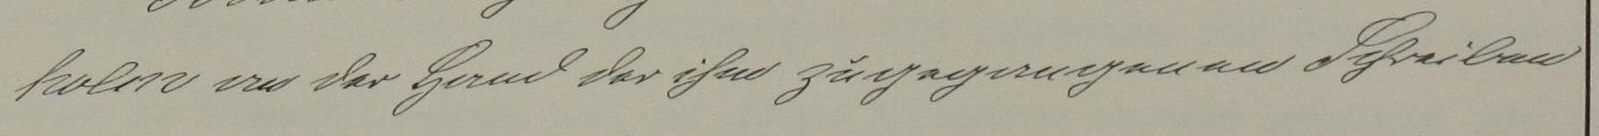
holm an der Hand der zugegangenen Schreiben
